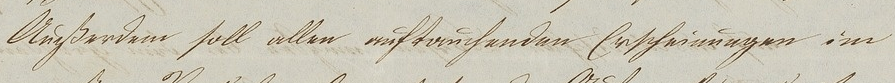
Außerdem soll allen auftauchenden Erscheinungen im
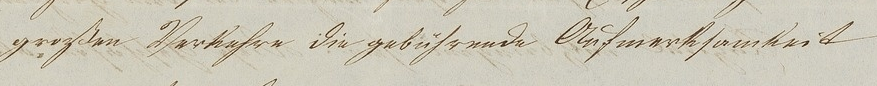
großen Verkehre die gebührende Aufmerksamkeit
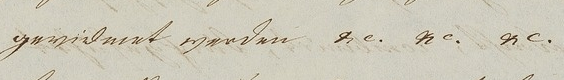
gewidmet werden etc. etc. etc.
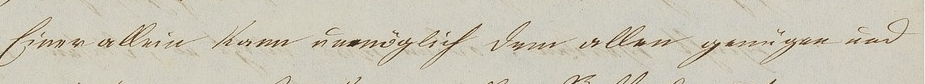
Einer allein kann unmöglich dem allen genügen und
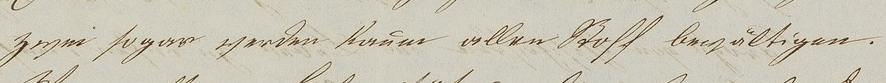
zwei sogar werden kaum allen Stoff bewältigen.
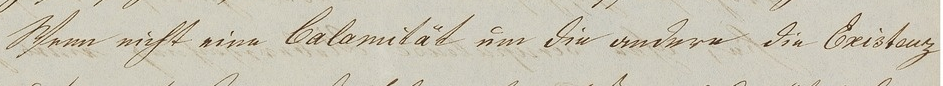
Wenn nicht eine Calamität um die andere die Existenz
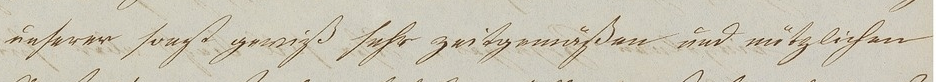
unserer sonst gewiß sehr zeitgemäßen und nützlichen
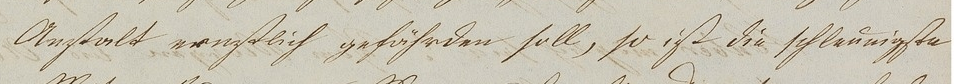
Anstalt ernstlich gefährden soll, so ist die schleunigste
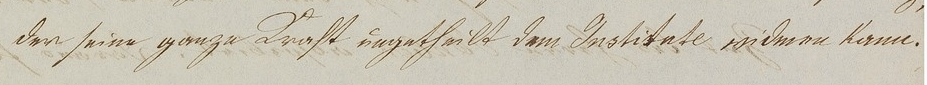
der seine ganze Kraft ungetheilt dem Institute widmen kann.
